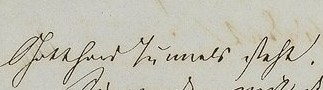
GotthardTunnels steht.
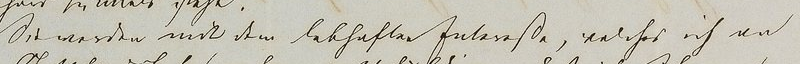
Sie werden mit dem lebhaften Interesse, welches ich an
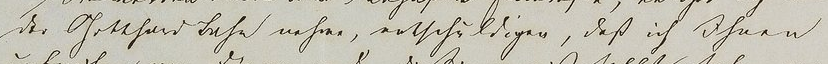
der Gotthard-Bahn nehme, entschuldigen, daß ich Ihnen
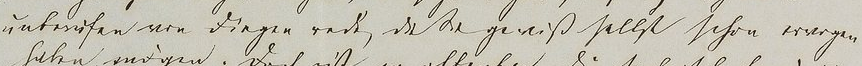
unberufen von Dingen rede, die Sie gewiß selbst schon erwogen
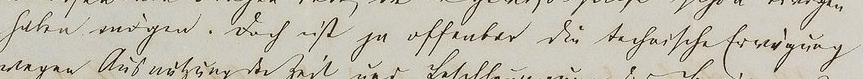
haben mögen. Doch ist ja offenbar die technische Erwägung
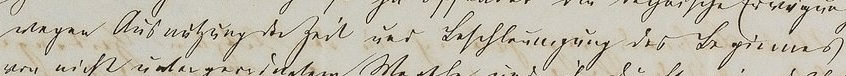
wegen Ausnützung der Zeit und Beschleunigung des Beginnes
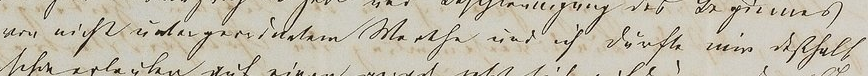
von nicht untergeordnetem Werthe und ich durfte mir deßhalb
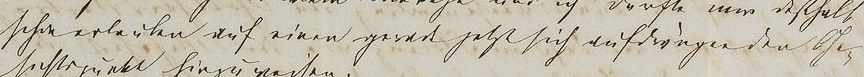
schon erlauben auf einen gerade jetzt sich aufdrängenden Ge-
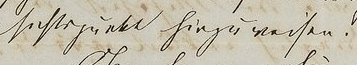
sichtspunkt hinzuweisen.
